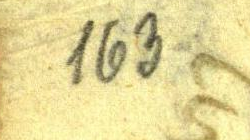163
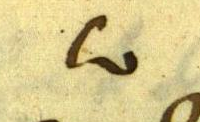t
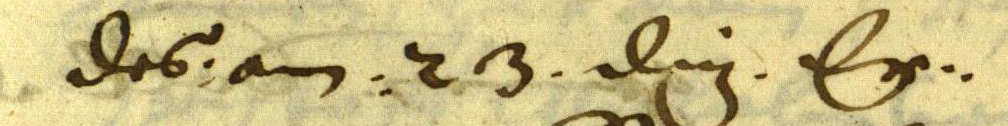des. am: 23. diz. Er¬
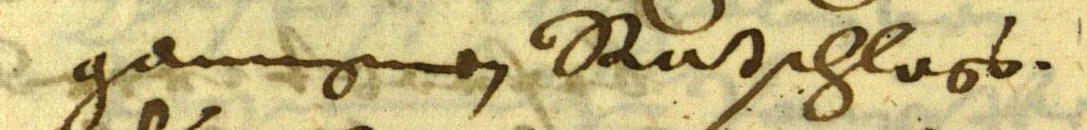ganngnen Ratschlags.
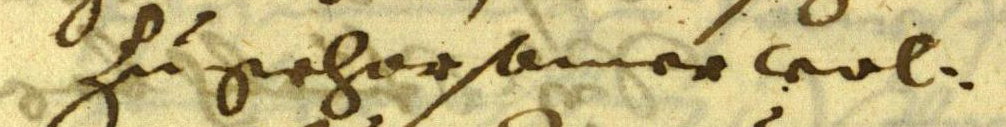Zū gehorsamer vol¬
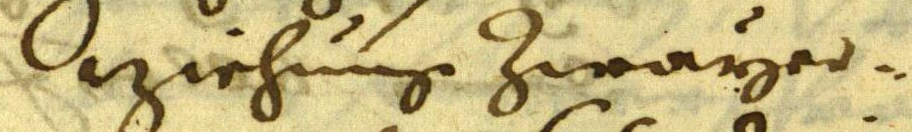ziehūng Zwaÿer
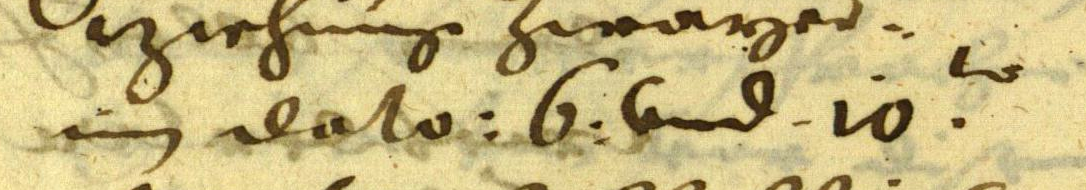im dato: 6. vnd 10.t
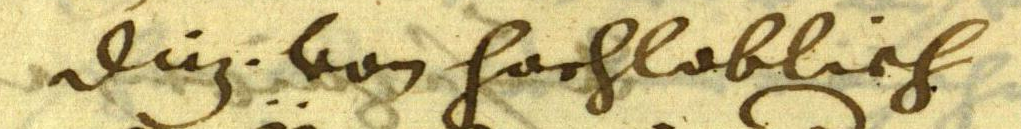diz. von hochloblich
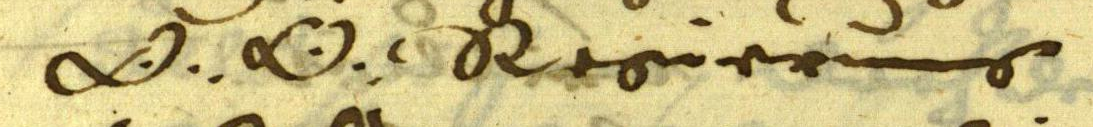O: Ö: Regierūng
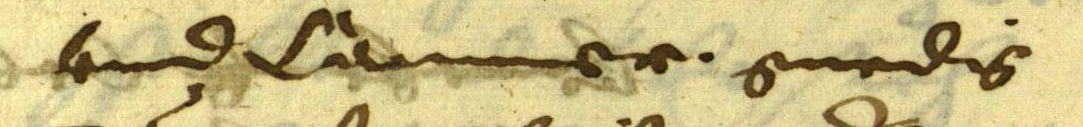vnd Cammer. gnedig
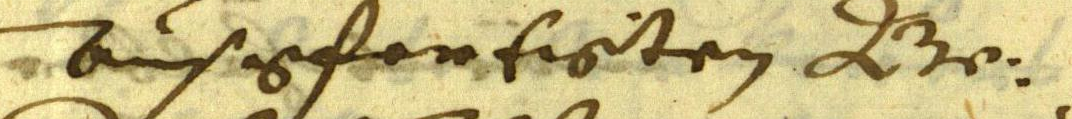Aūsgfertigten Be¬
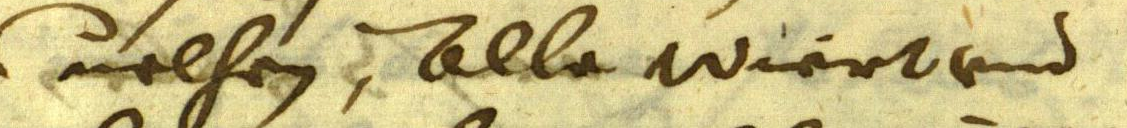ūelhen, Alle Wiert vnd
